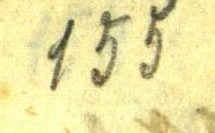155
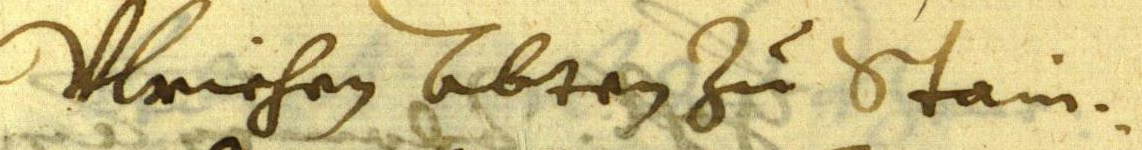Vlrichen Abten Zū Stain¬
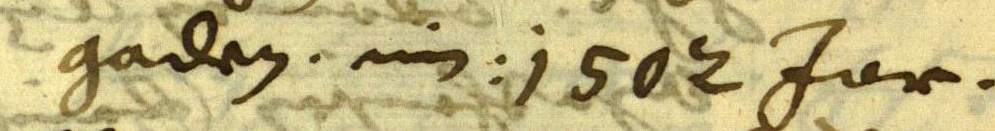gaden. im: 1502 Jar.
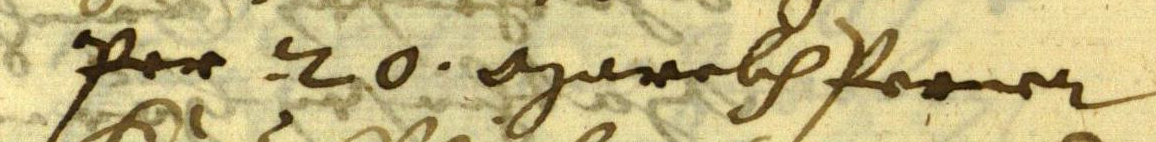Per .20. Marckh Perner
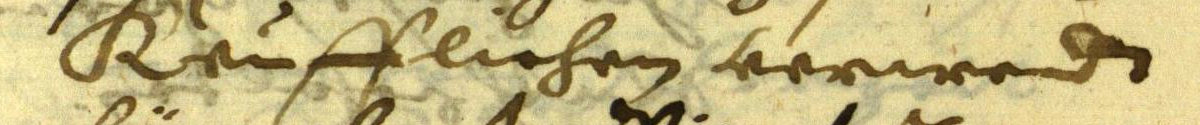Keūfflichen verwendt
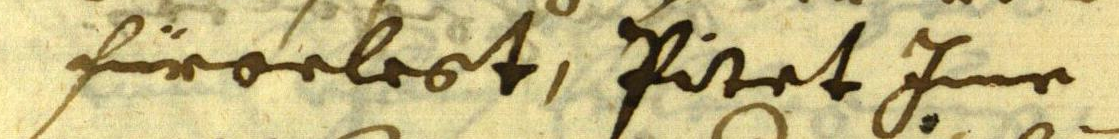fürgelegt, Pitet Ime
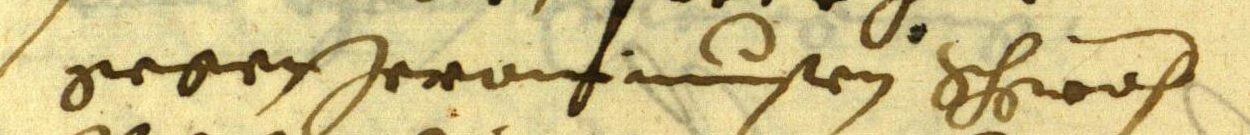gegen Jeronimūsen Schgraf
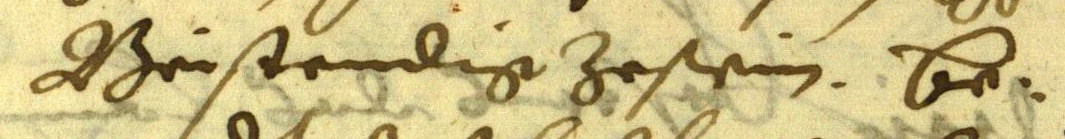Beistendig Zesein. be¬
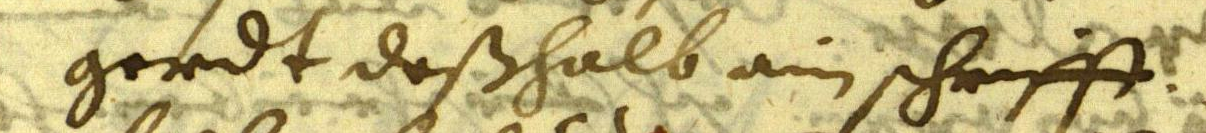gerdt deßhalb ain schrifft¬
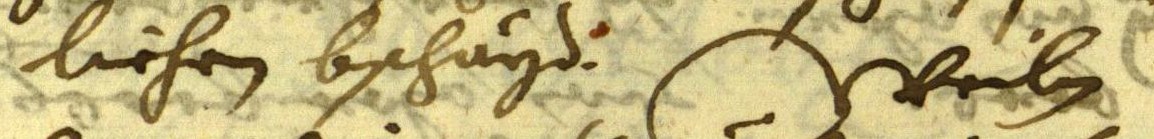lichen bschaȳd. Weiln
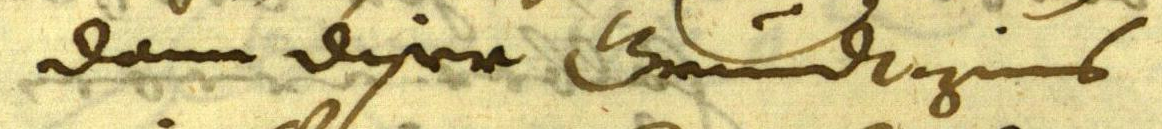dann diser Grūndtzins
